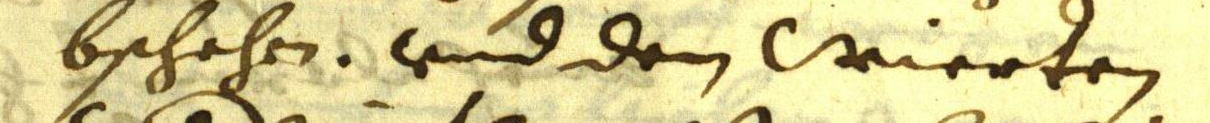bschehen. vnd den Wierten
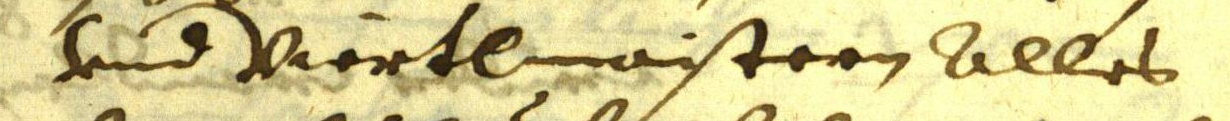vnd Viertlmaistern Alles
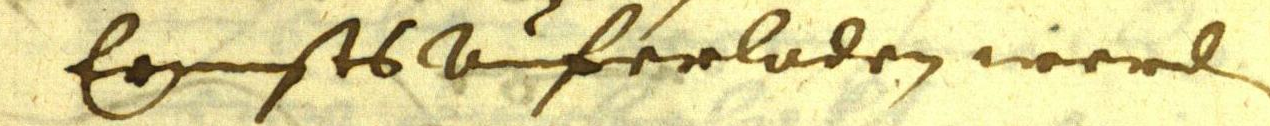Ernnsts Aūferladen werd.
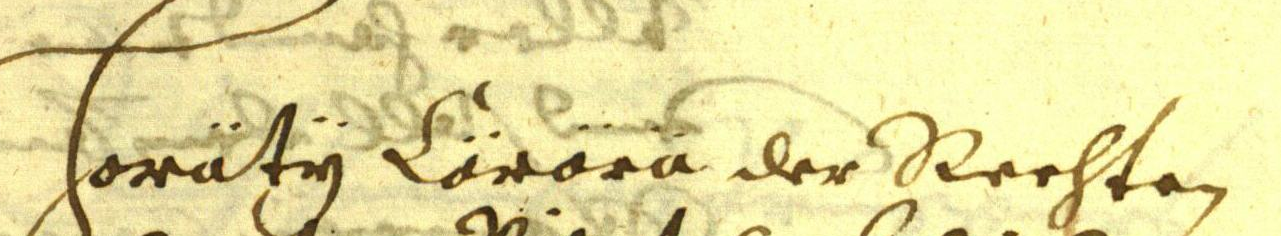Horätÿ Cärärä der Rechten
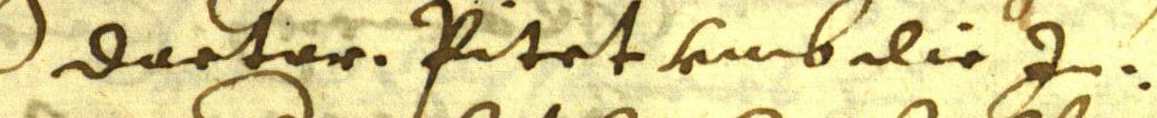doctor. Pitet vmb die In¬
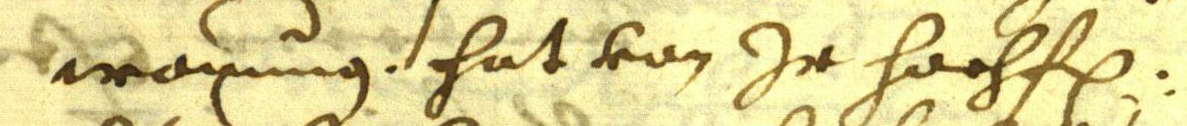wonūng. hat von Ir hochfl:
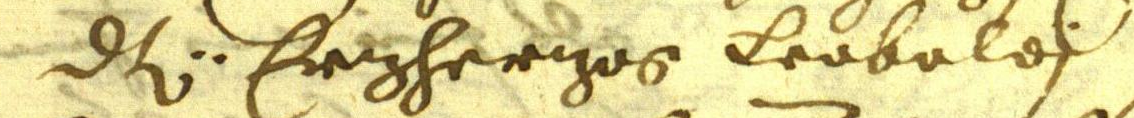dt: Erzhertzog Leoboldj
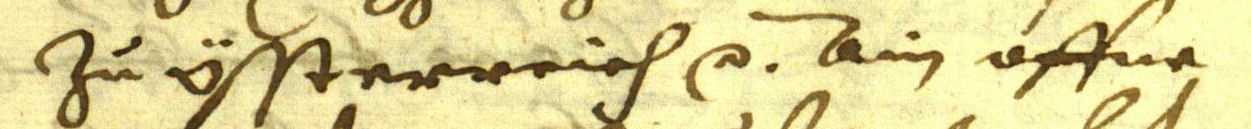Zū Össterreich etc. Ain offne
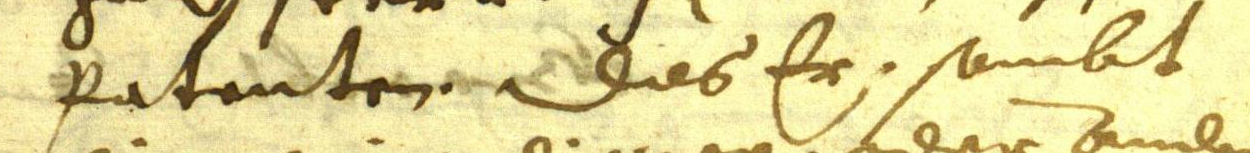Patenten. das Er. sambt
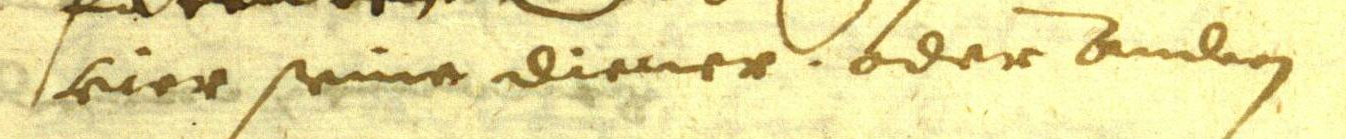vier seiner diener. oder Andern
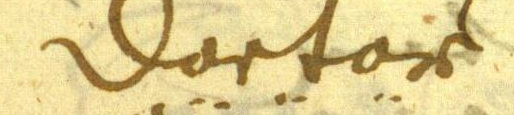Doctor
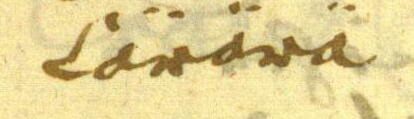Cärärä
